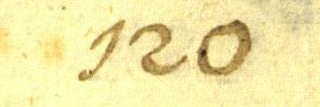120
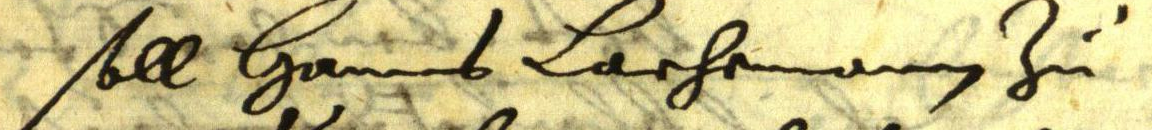soll Hanns Lochemann Zū
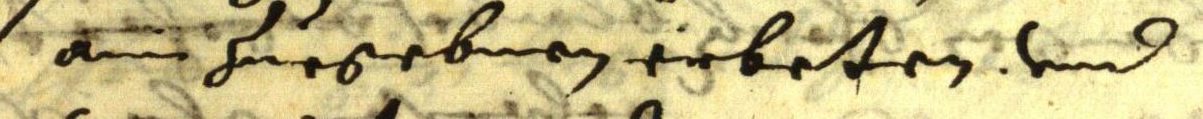ain Zūegebnen erbeten. vnd
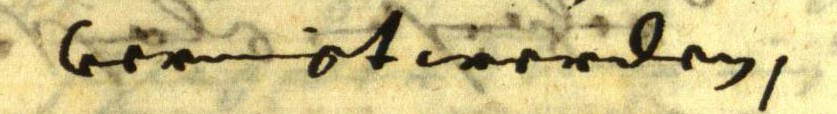vermigt werden,
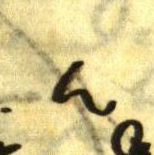t
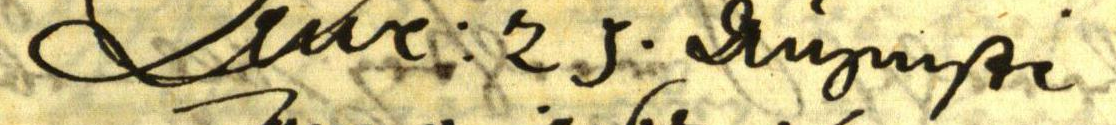Am: 21. Aūgūsti
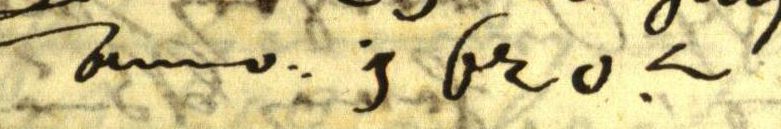Anno: 1620.t
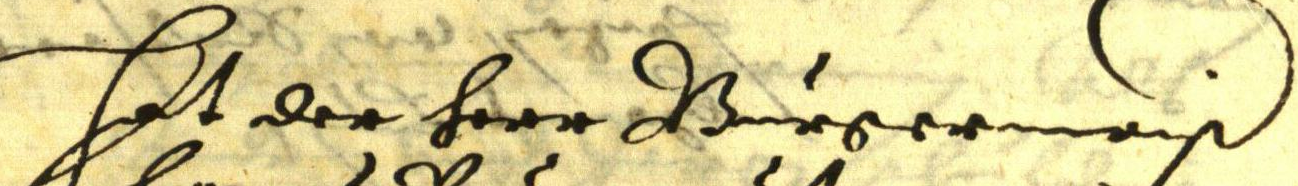hat der herr Būrgermaist
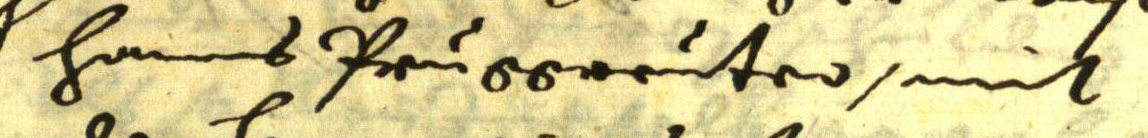Hanns Prūggreūter, mit
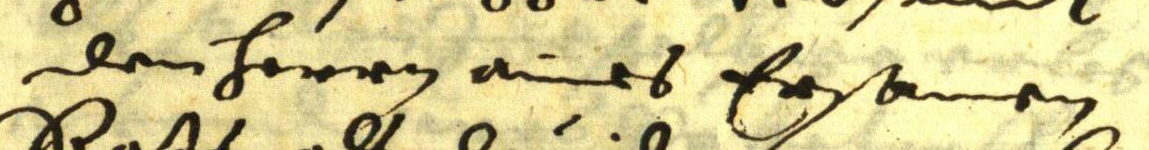den herrn aines Ersamen
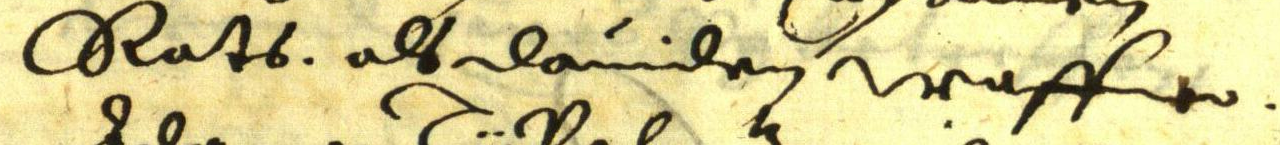Rats. als Daūiden Waffner.
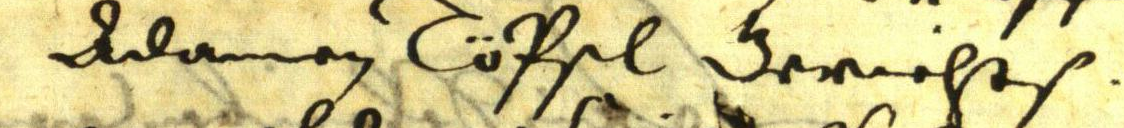Adamen TöPsl Gerichts¬
